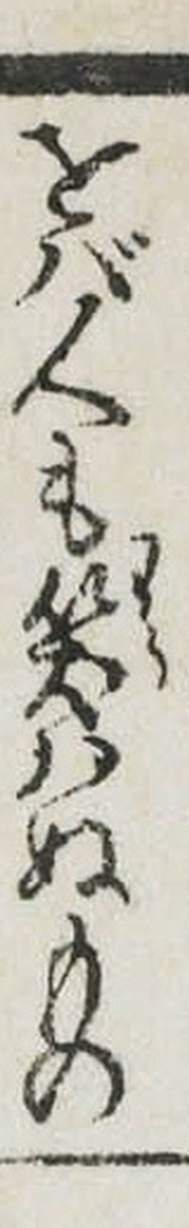をば人も笑はぬもの
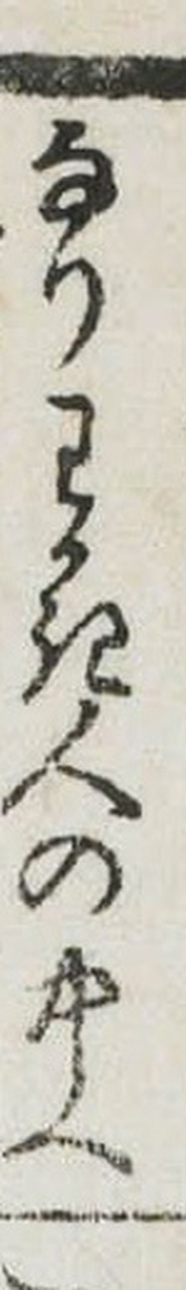なりわかき人の中へ
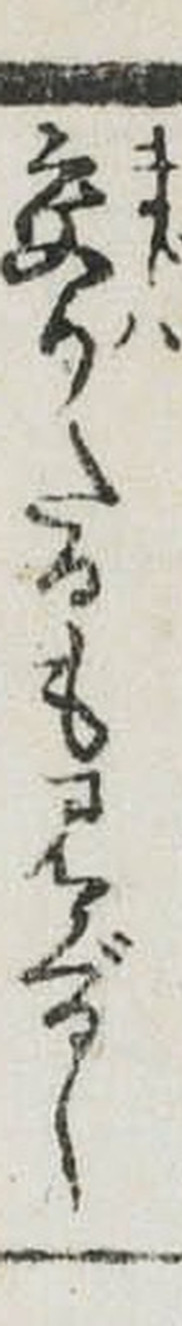交りたるも見ぐるし
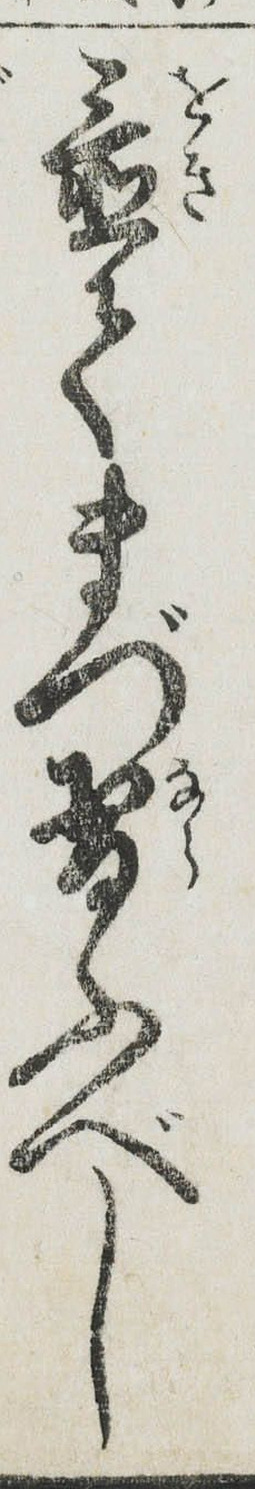置てまづ習ふべし
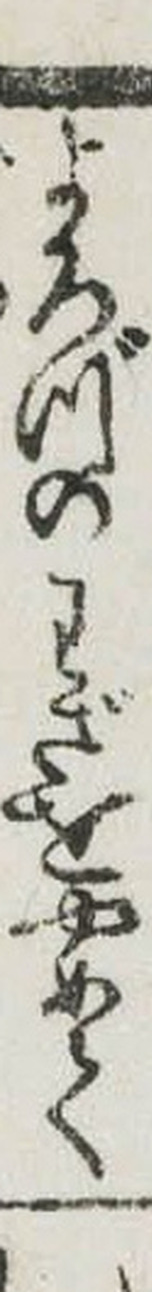よろづのわざをやめて
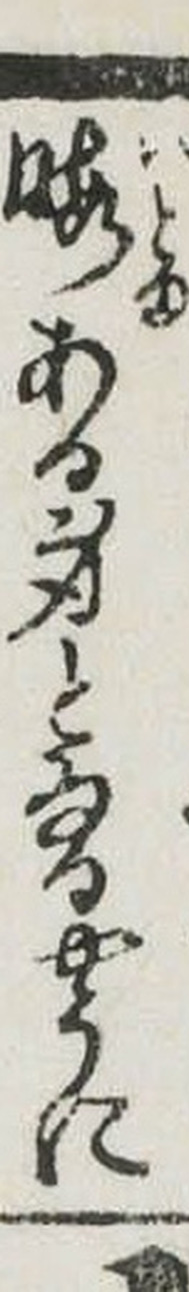暇ある身となるやうに
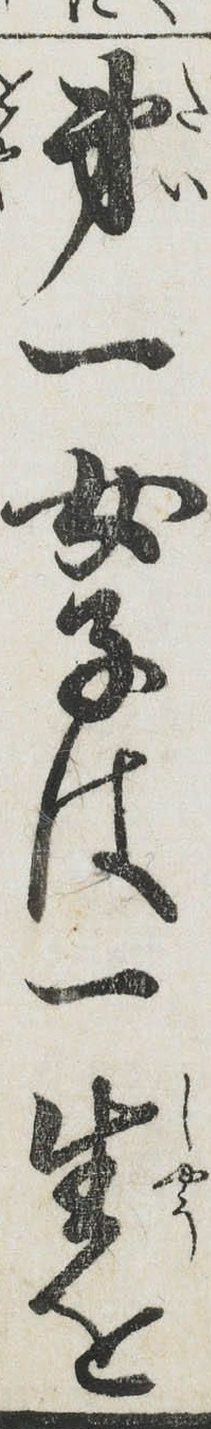第一女子は一生を
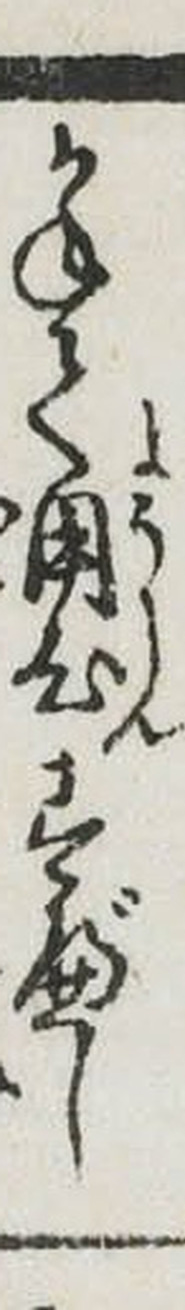かねて用心すべし
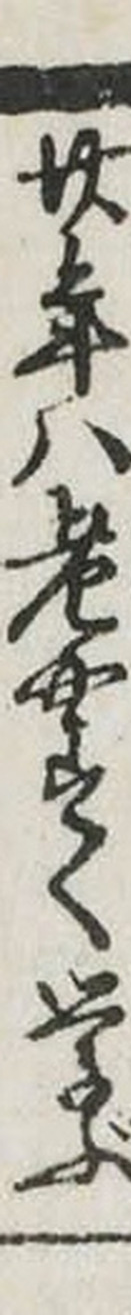廿年は老やすく学ぶ
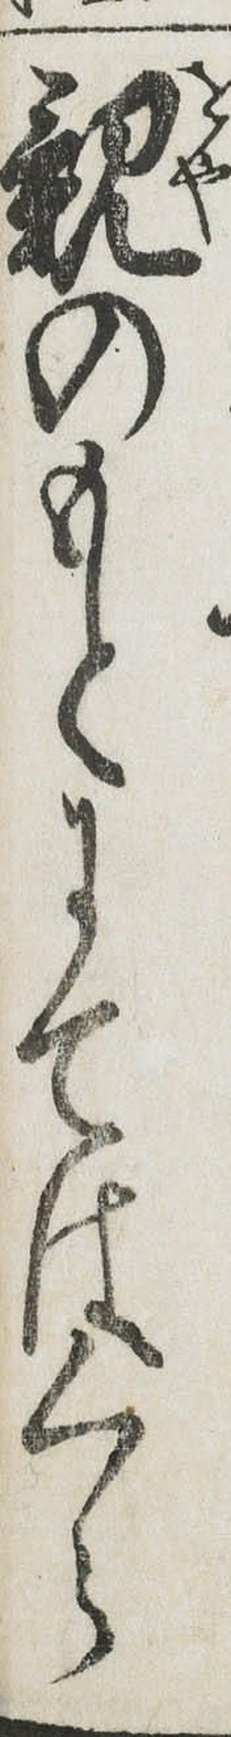親のもとにてはくら
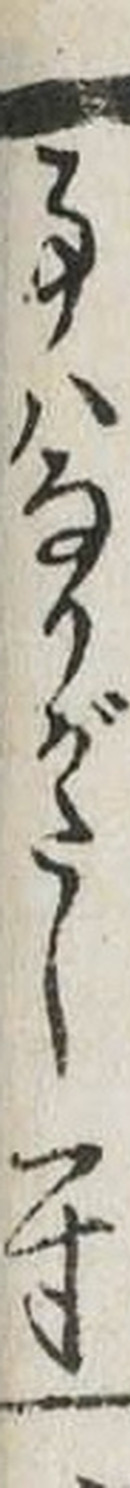事はなりがたし一寸
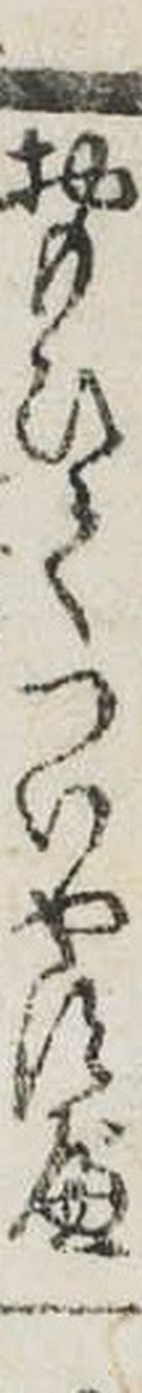おもひてついやすべ
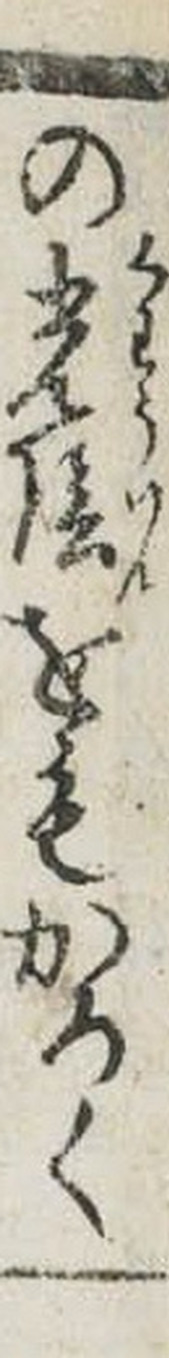の光陰をもかろく
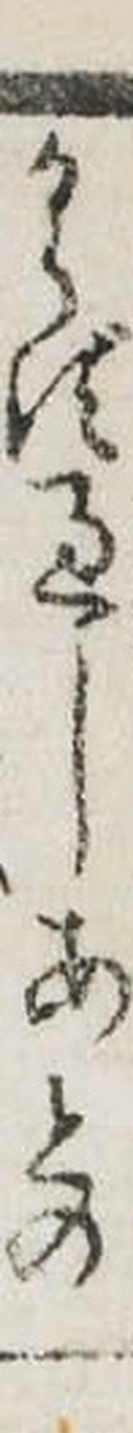からず過しあとの
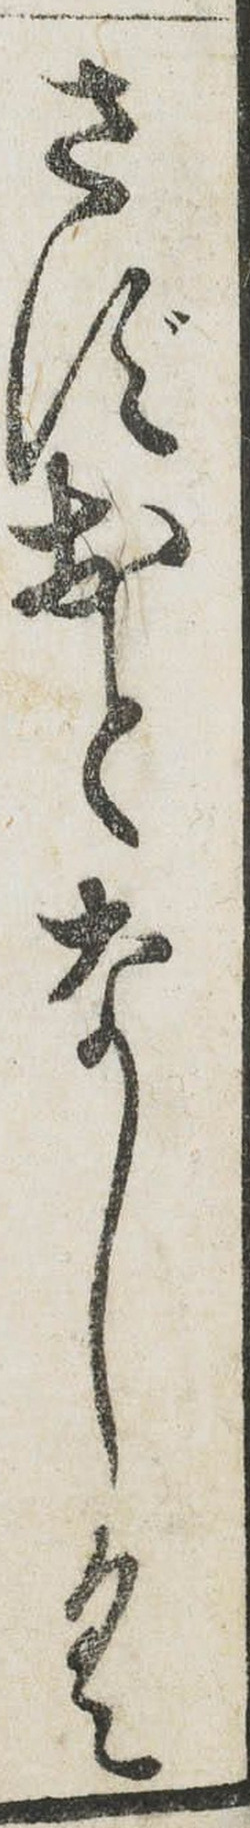さずおとなしく
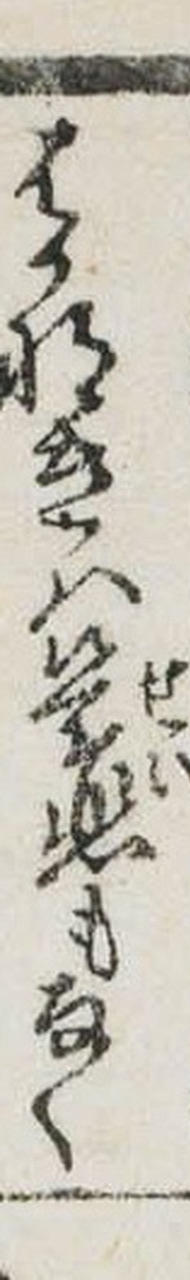はかなきは是悲もなく
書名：頭書萬用婦人手紙之文言
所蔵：東京学芸大学教育コンテンツアーカイブ
